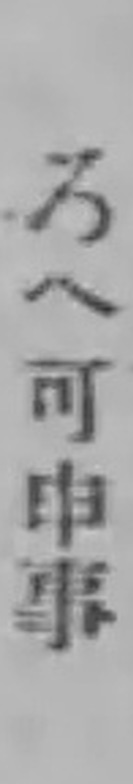ろへ可申事
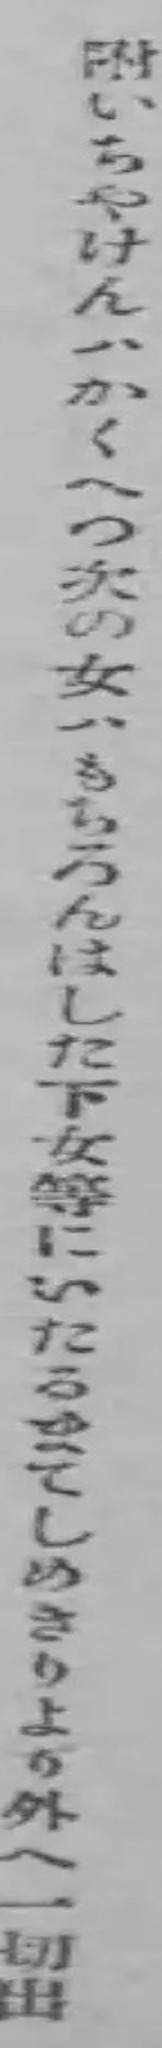附いちやけんはかくへつ次の女はもちろんはした下女等にいたるまてしめきりより外へ一切出
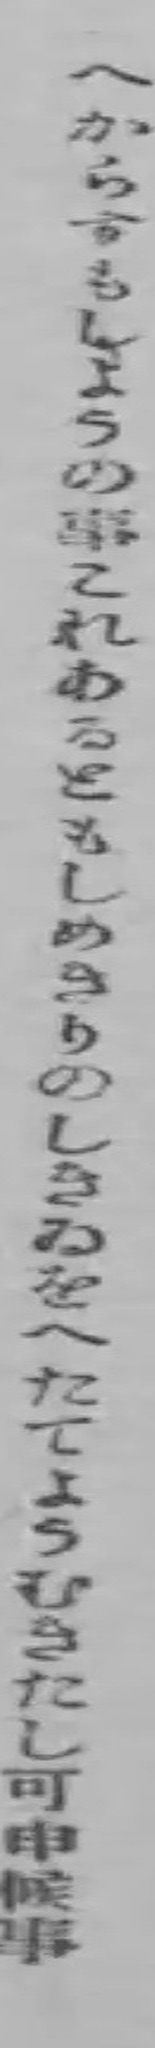へからすもしようの事これあるともしめきりのしきゐをへたてようむきたし可申候事
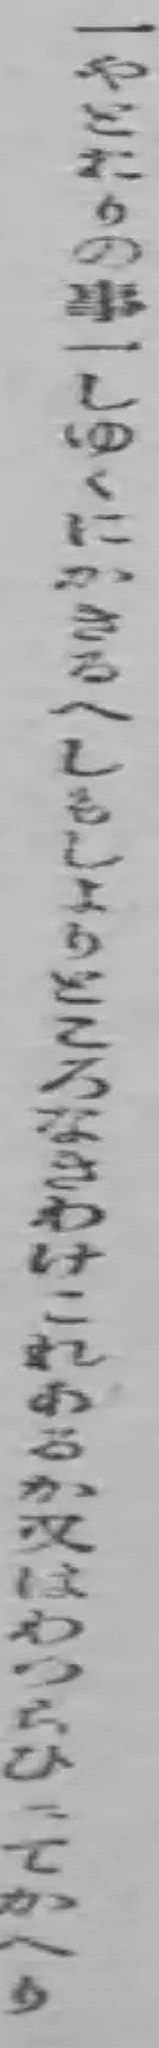一やとおりの事一しゆくにかきるへしもしよりところなきわけこれあるか又はわつらひニてかへり
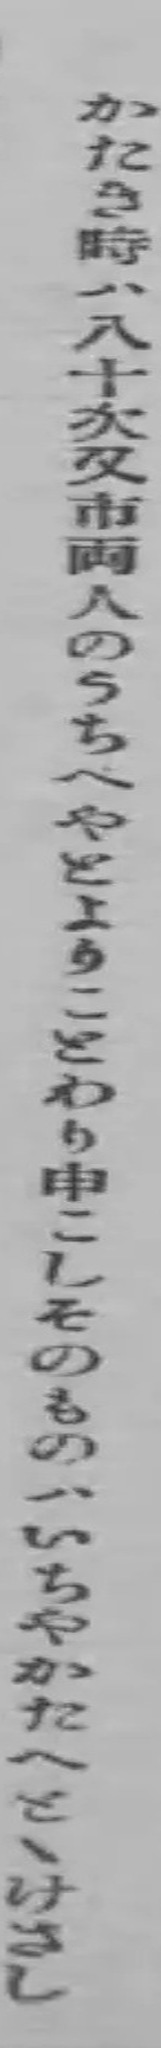かたき時は八十次又市両人のうちへやとよりことわり申こしそのものはいちやかたへとゝけさし
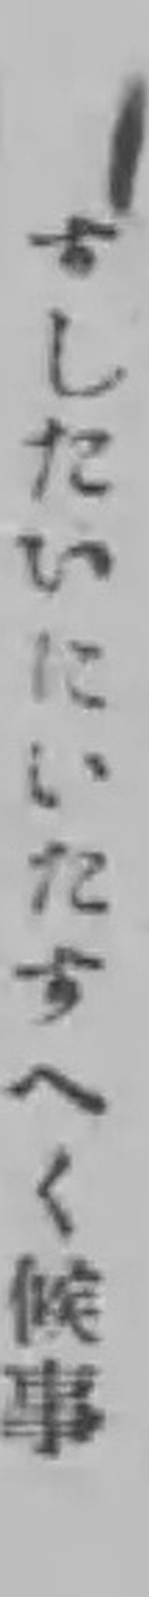すしたいにいたすへく候事
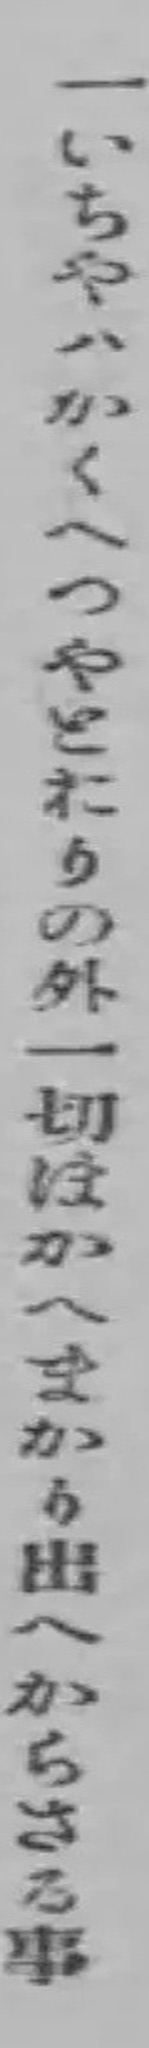一いちやはかくへつやとおりの外一切ほかへまかり出へからさる事
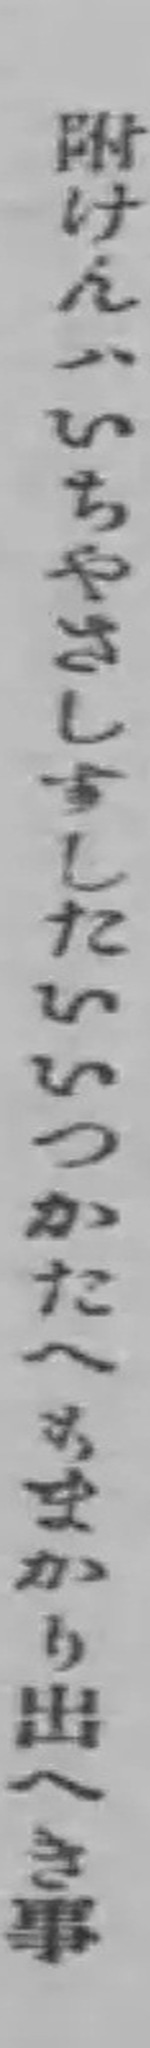附けんはいちやさしすしたいいつかたへもまかり出へき事
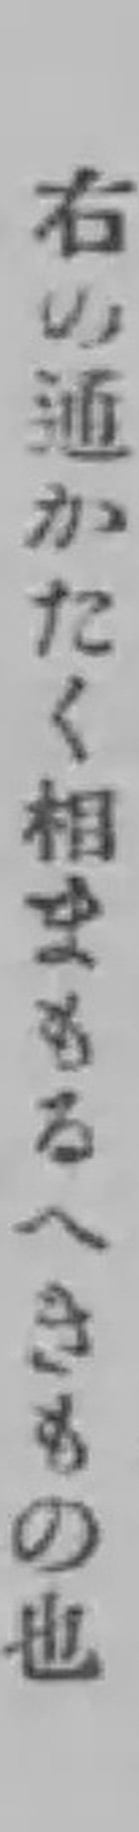右の通かたく相まもるへきもの也
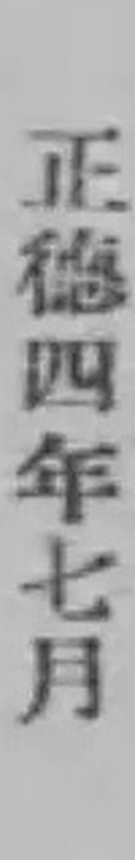正徳四年七月日
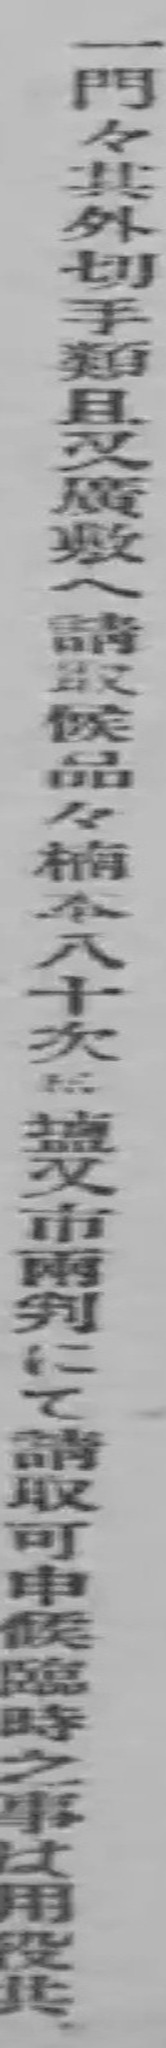一門々其外切手類且又広敷へ請取候品々楠本八十次長塩又市両判にて請取可申候臨時之事は用役共
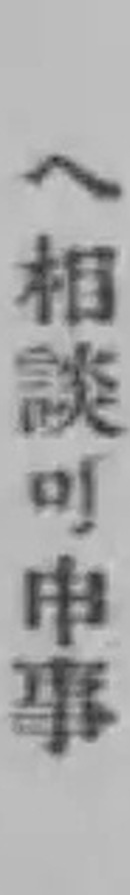へ相談可申事
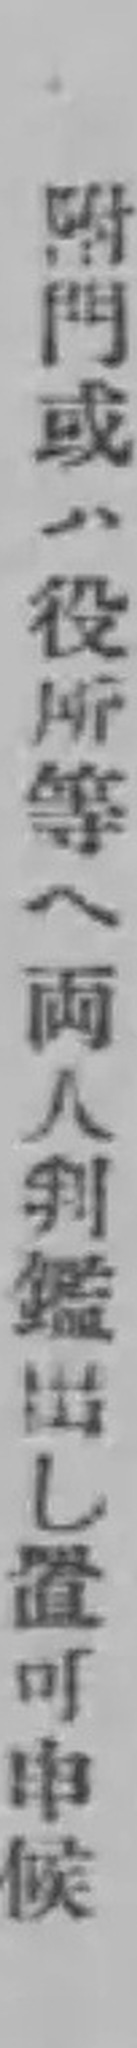附門或は役所等へ両人判鑑出し置可申候
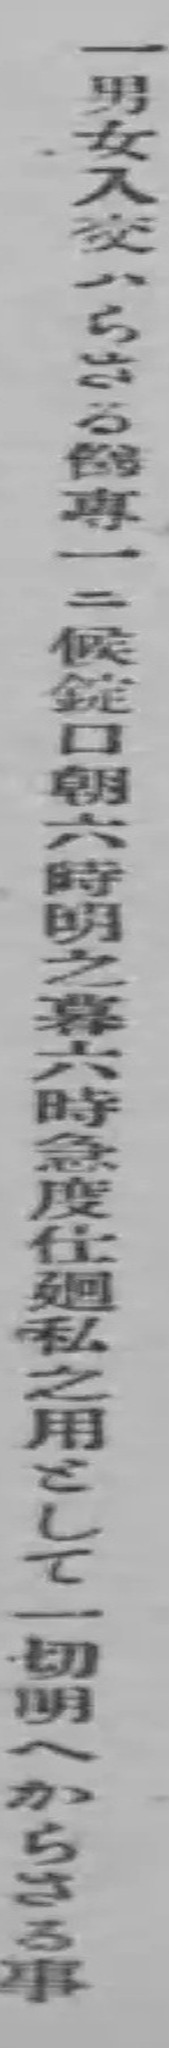一男女入交はらさる儀専一ニ候錠口朝六時明之暮六時急度仕廻私之用として一切明へからさる事
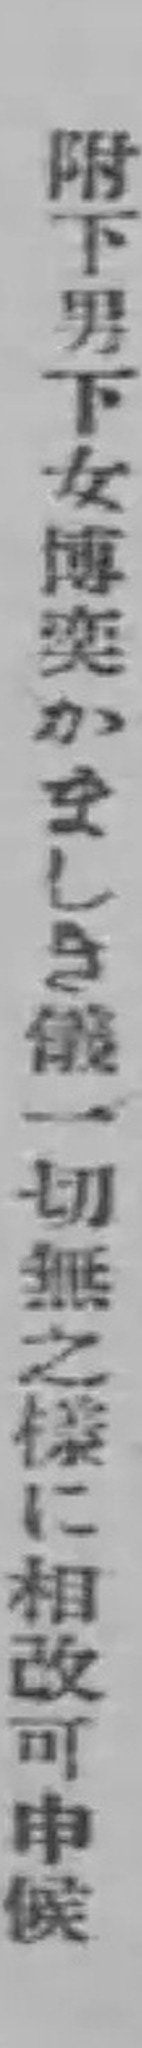附下男下女博奕かましき儀一切無之様に相改可申候
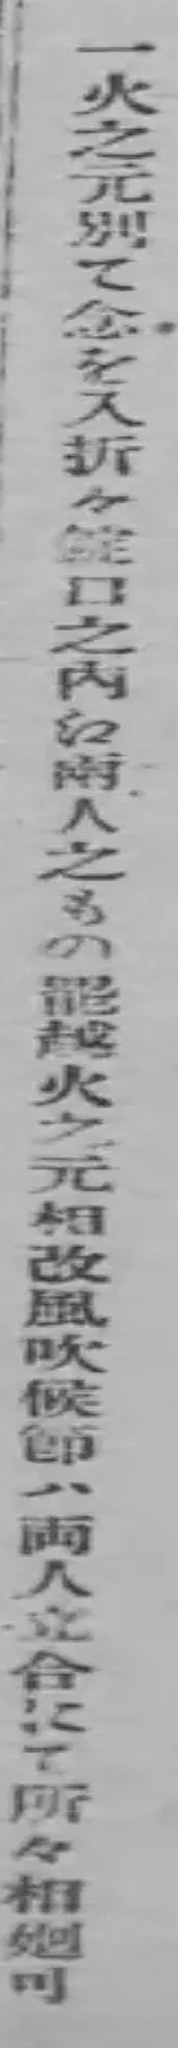一火之元別て念を入折々錠口之内え両人之もの罷越火之元相改風吹候節は両人立合にて所々相廻可
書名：豊橋市史談
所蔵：国立国会図書館 National Diet Library, JAPAN
